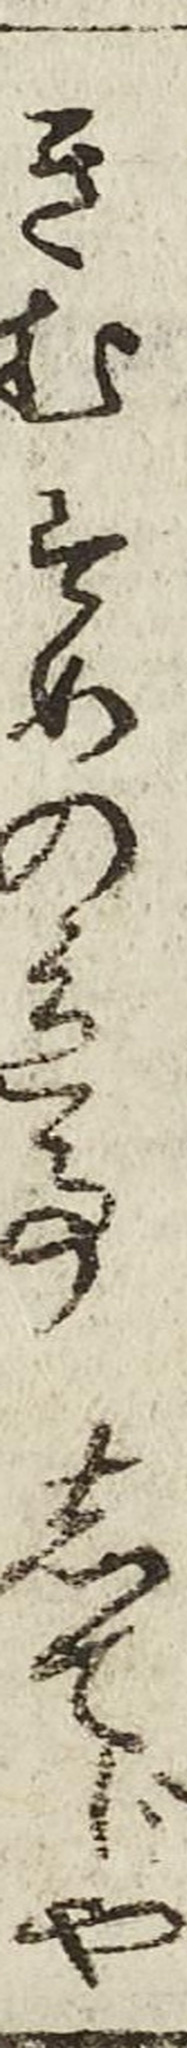きむすめの色事してじや
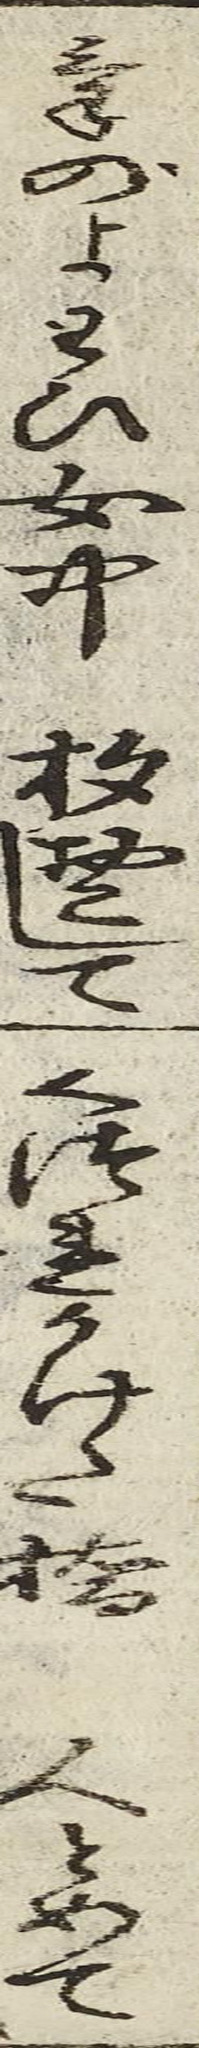気がよわひ女中杓おこして
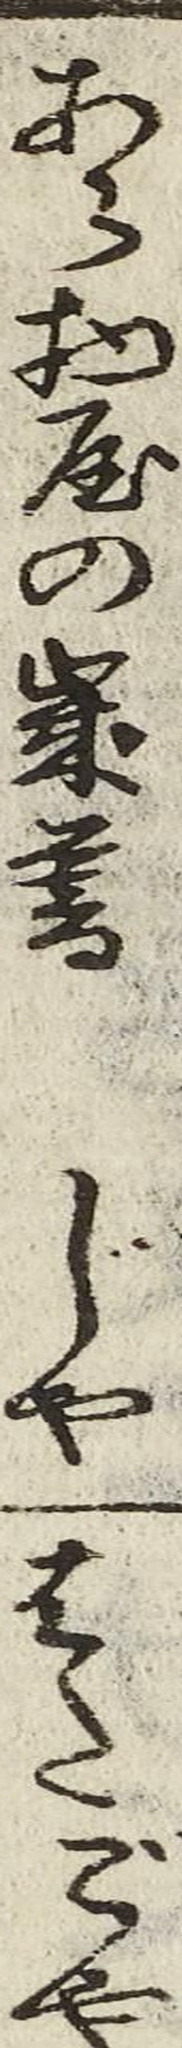あら物屋の歳暮じや
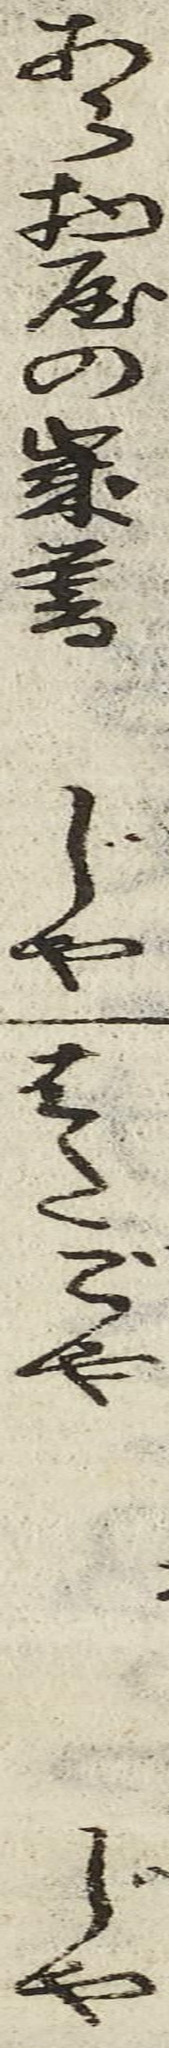あら物屋の歳暮じや
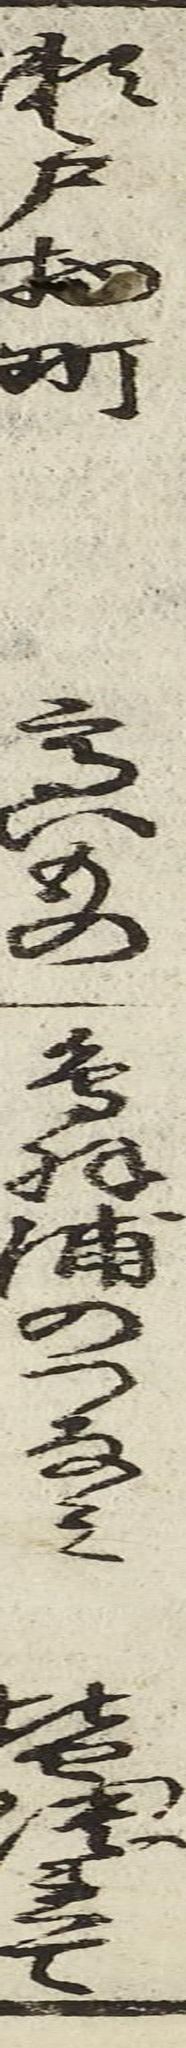瀬戸物町高いもの
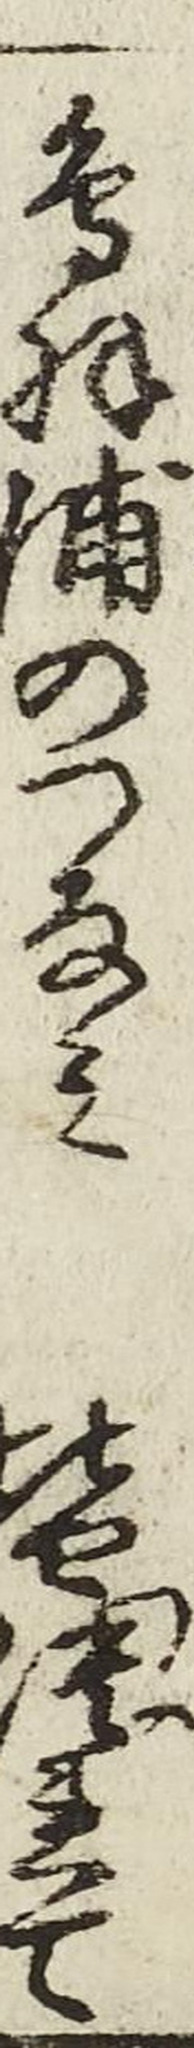鳥羽浦のつなみ皆潰れて
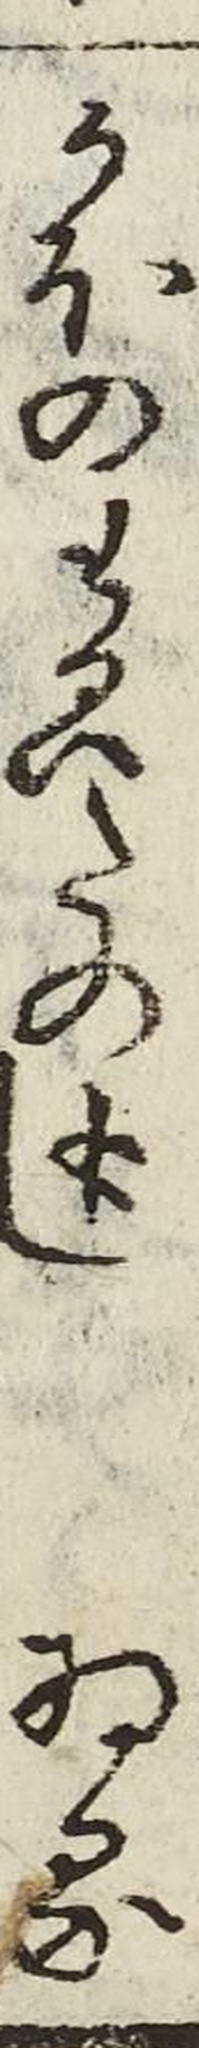かほのわるいたのもしゐるか
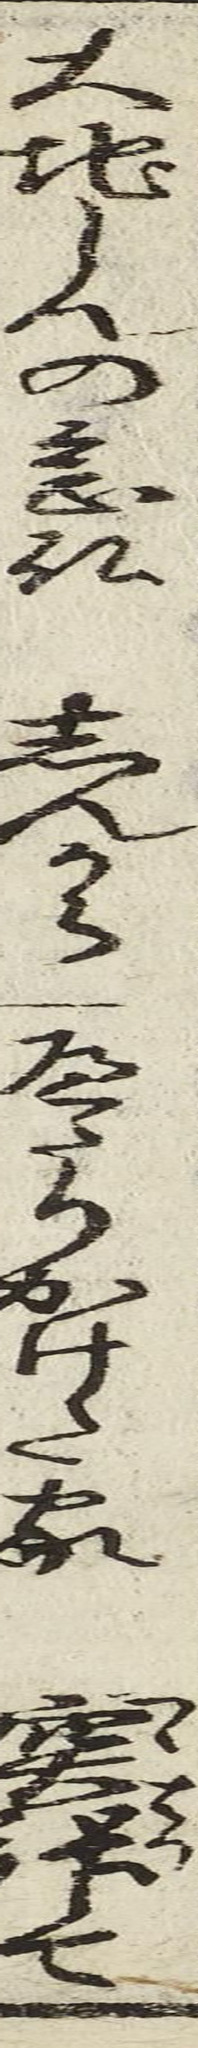大地しんの念仏しんから
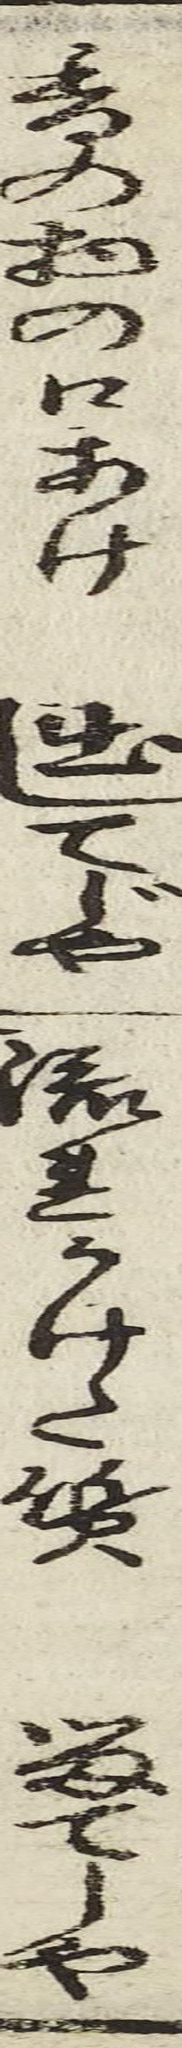香の物の口あけ出してじや
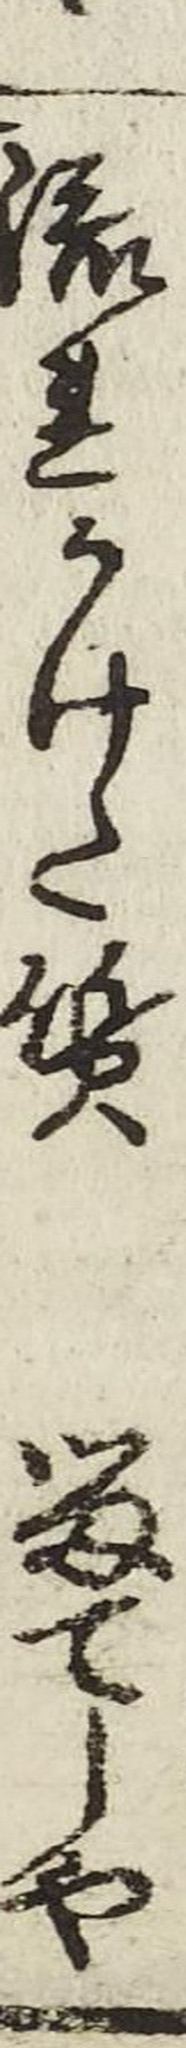流れかけた質留てしや
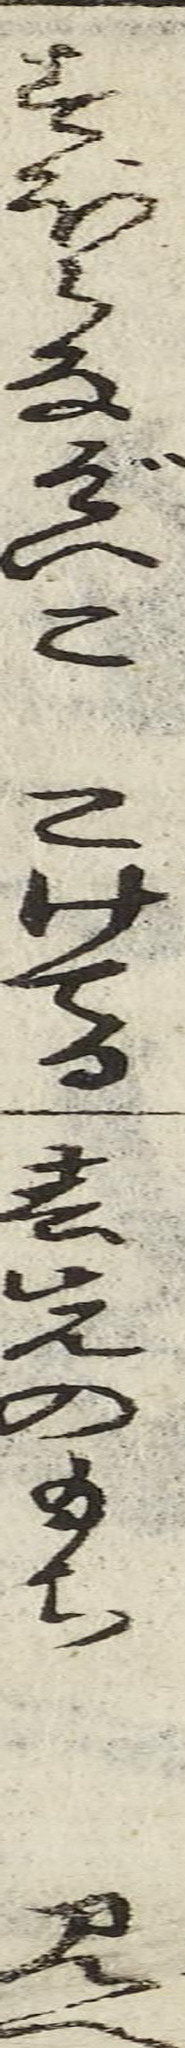すぼらなげいここけてる

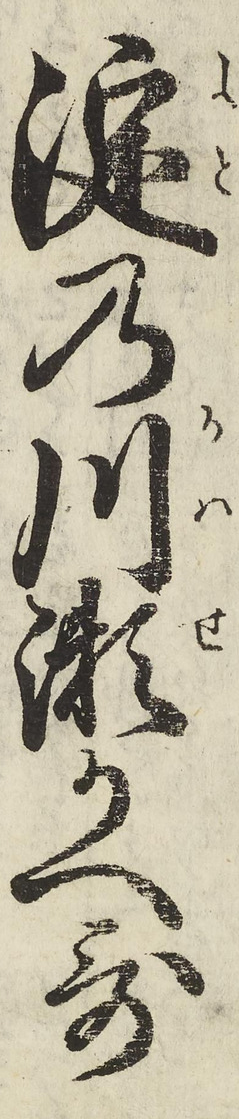淀の川瀬かへ歌
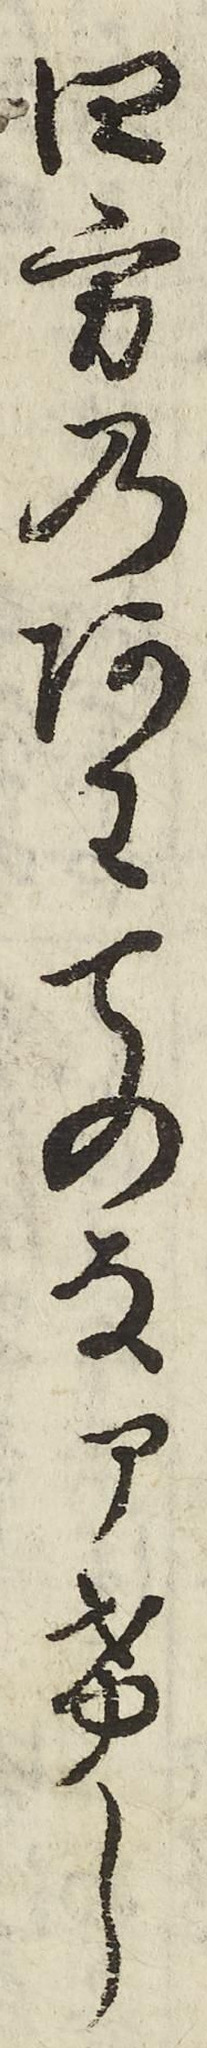四方のあわてのなアけし
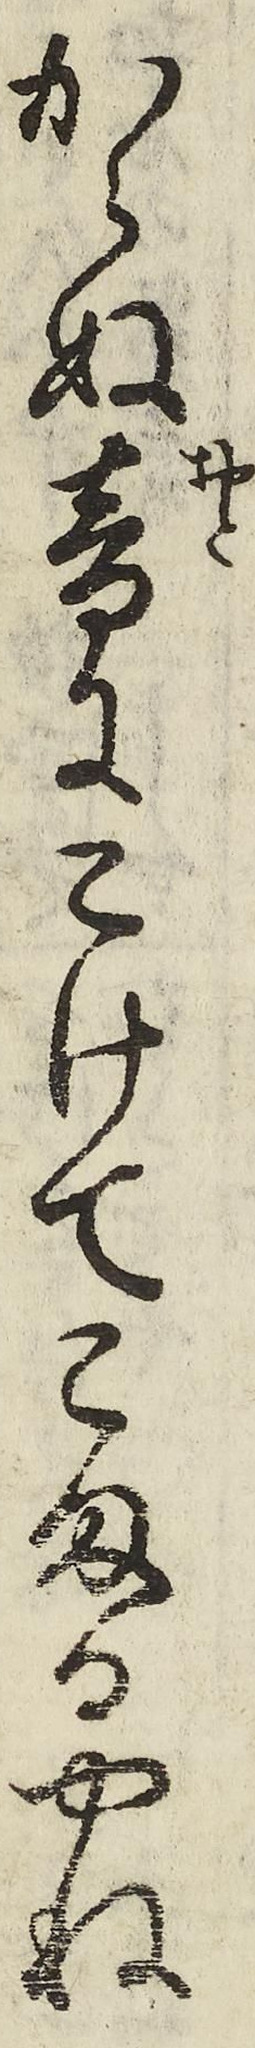からぬ音にこけてこまるやね
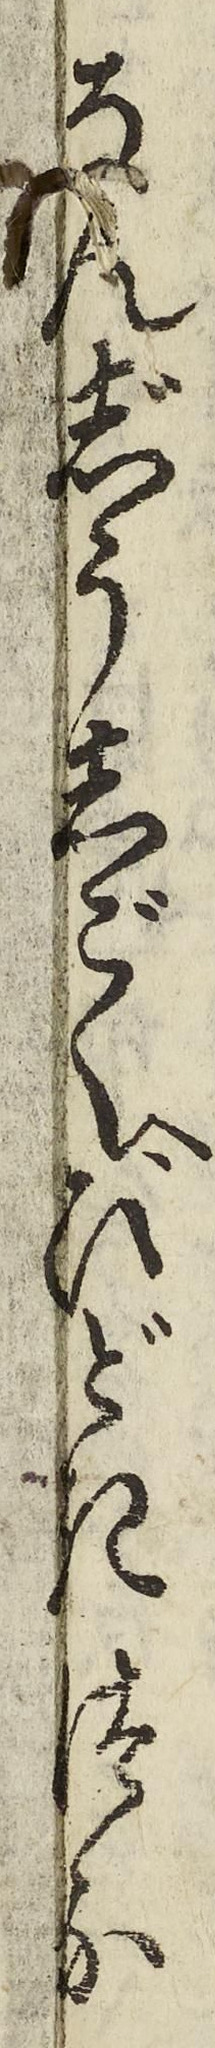なんじうしごく、ひどきつな
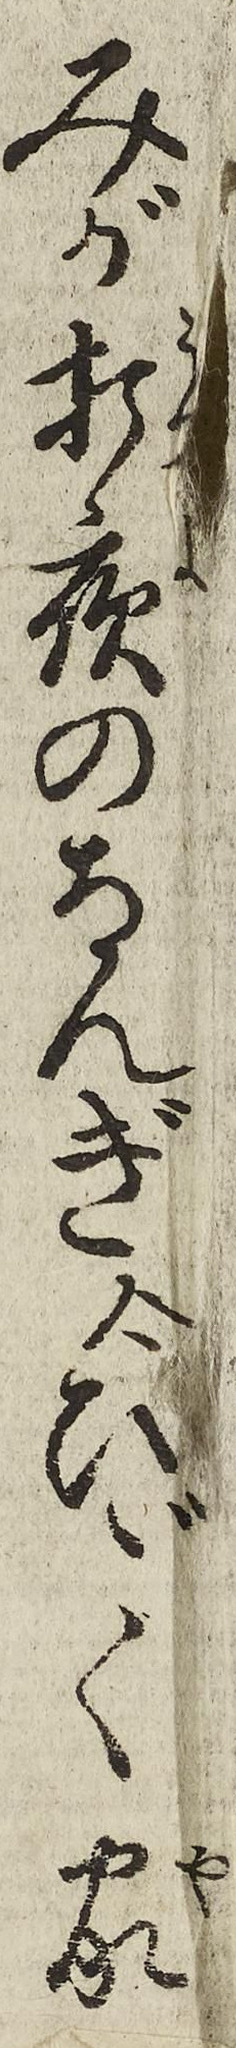みが打夜のなんぎ、ひゞく家
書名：地震津浪末代噺の種　全
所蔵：東京大学地震研究所図書室 Earthquake Research Institute Library, The University of Tokyo, JAPAN
